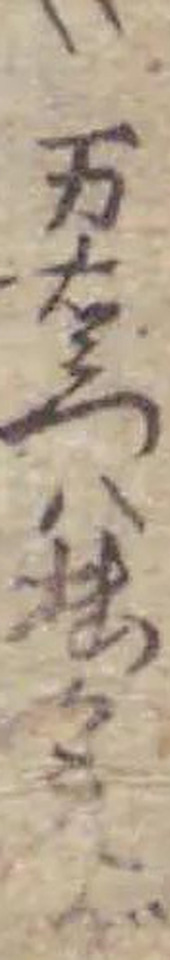万右衛門は梅かえが
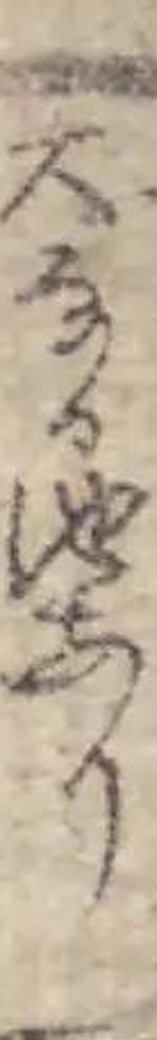大なる池あり
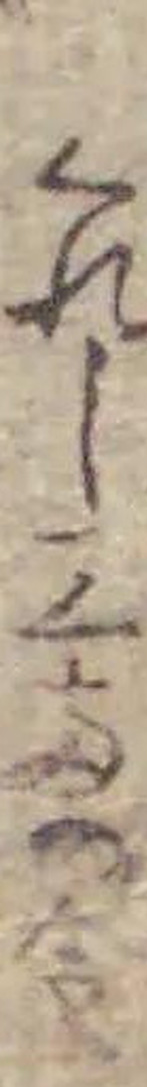くれし三両の金
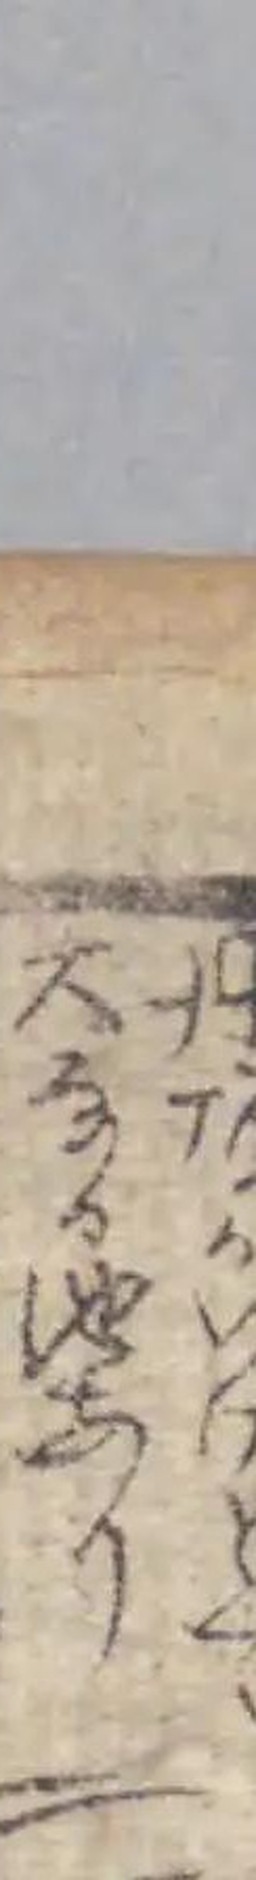大なる池あり
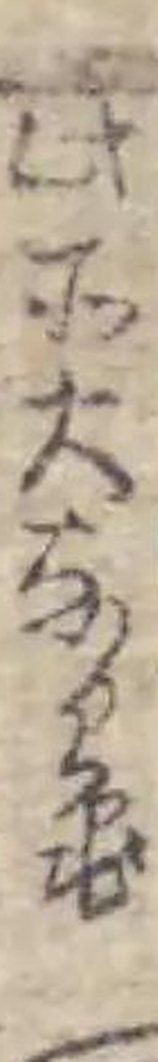此所大なる亀
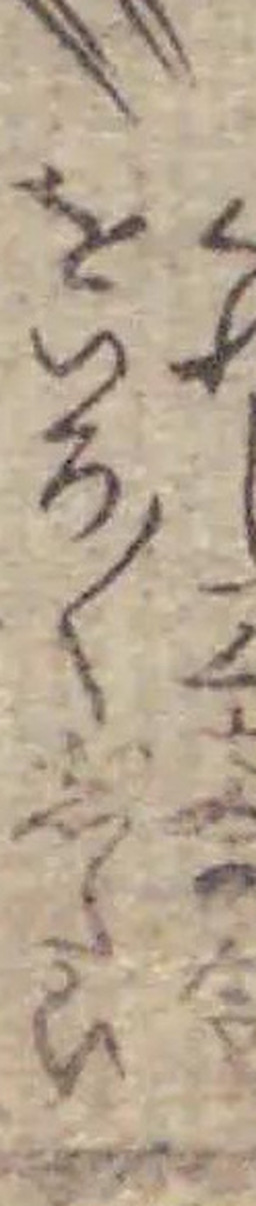をいろ〳〵じたい
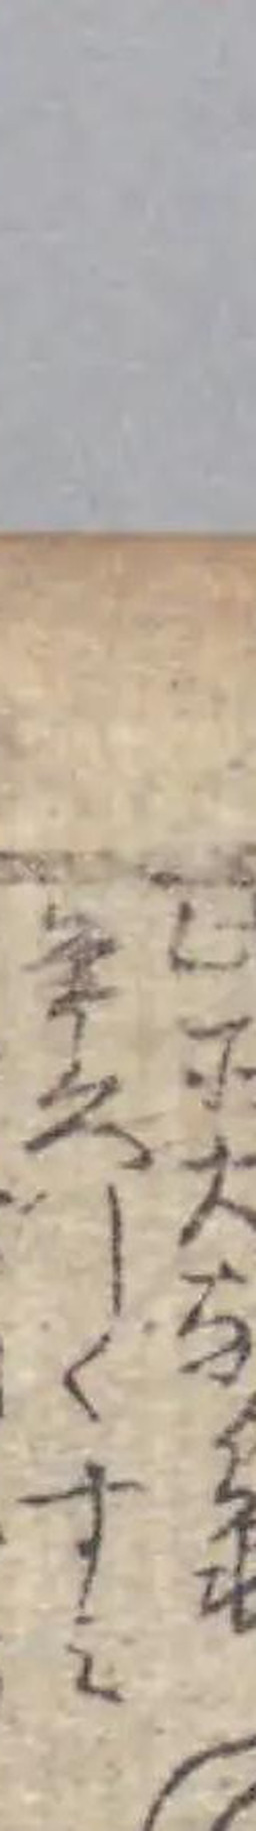年久しくすみ
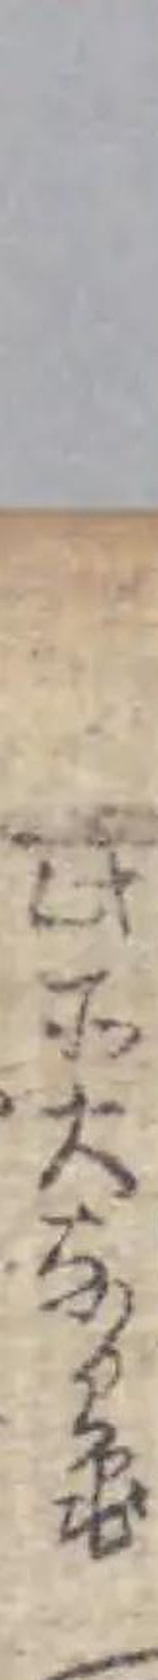此所大なる亀
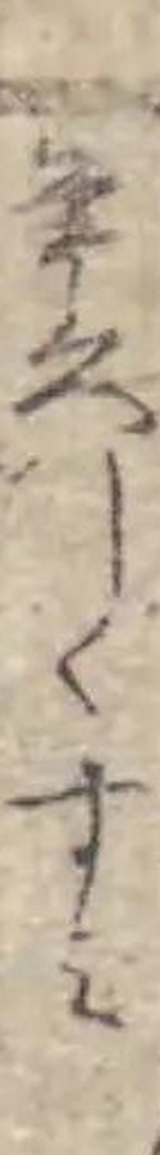年久しくすみ
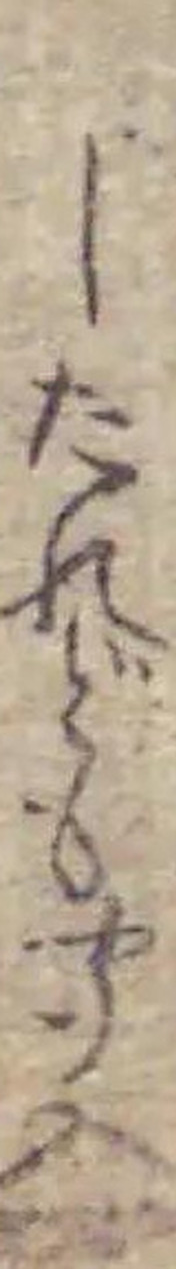したれども聞入
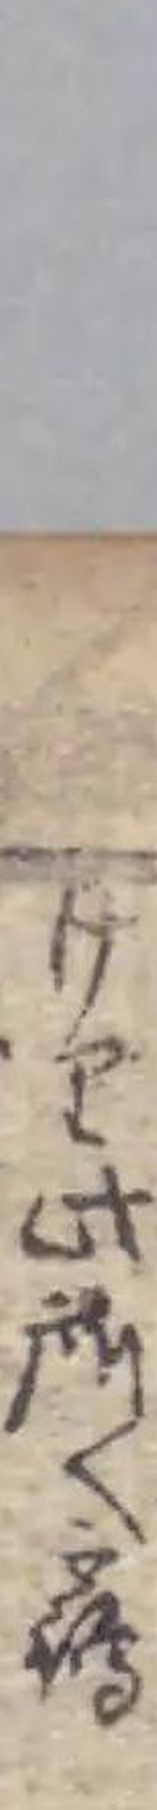けり此所へ鶴
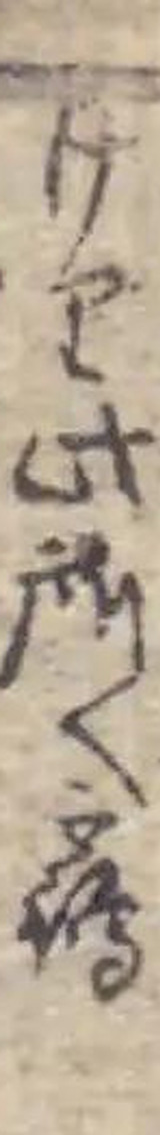けり此所へ鶴
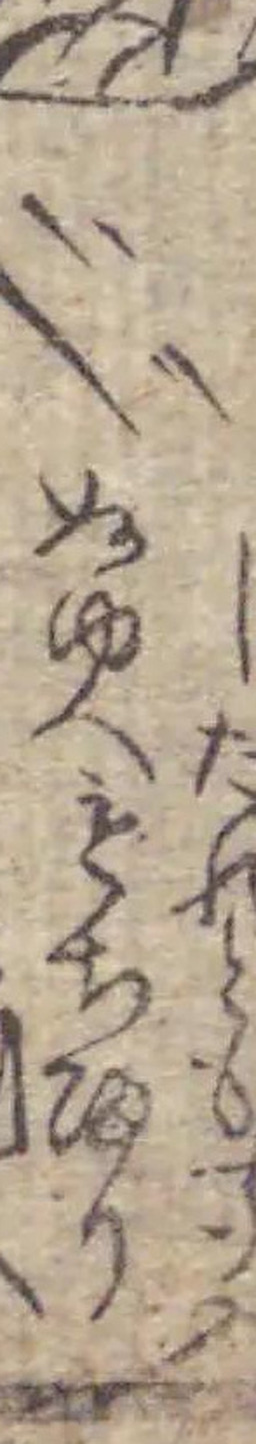ぬゆへもち帰り
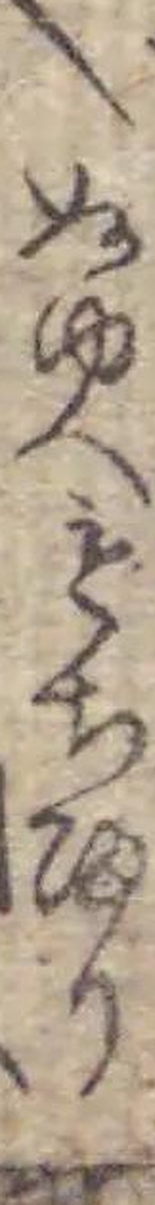ぬゆへもち帰り
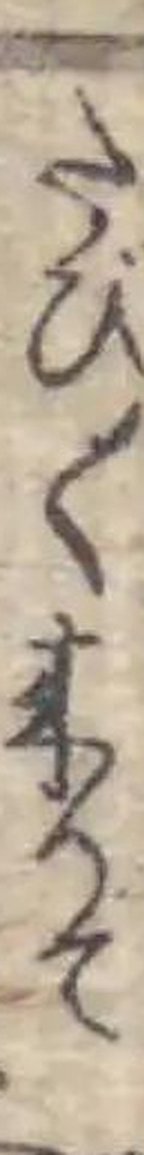たび〳〵来りて
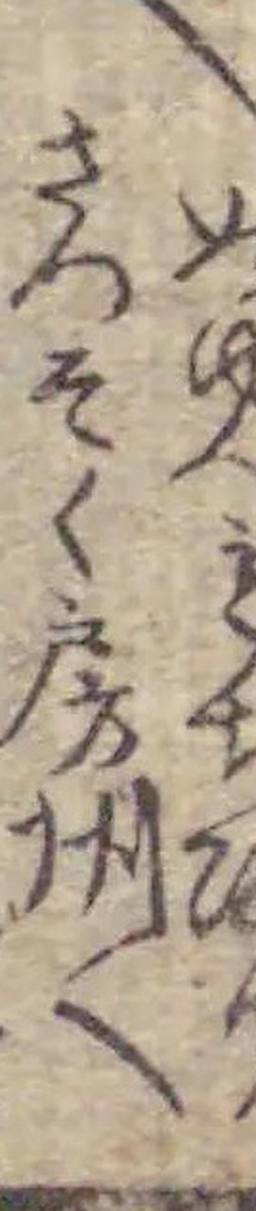さつそく房州へ
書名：見立蓬莱 : 2巻
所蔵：国立国会図書館 National Diet Library, JAPAN
